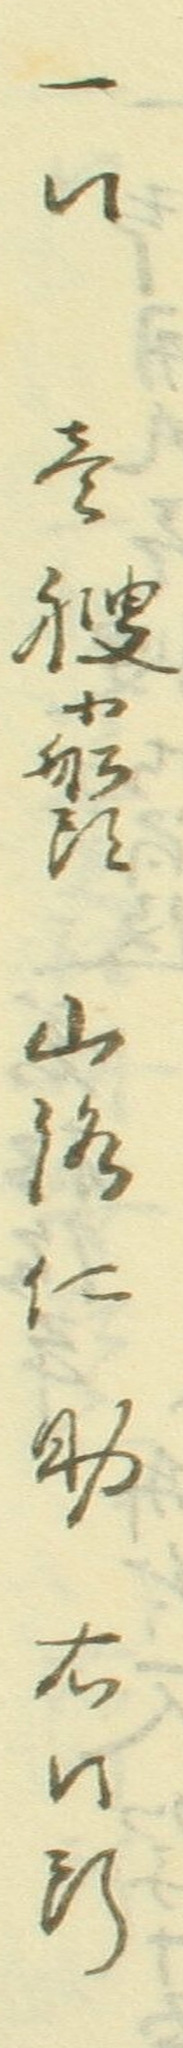一同壱艘小船頭山路仁助右同断
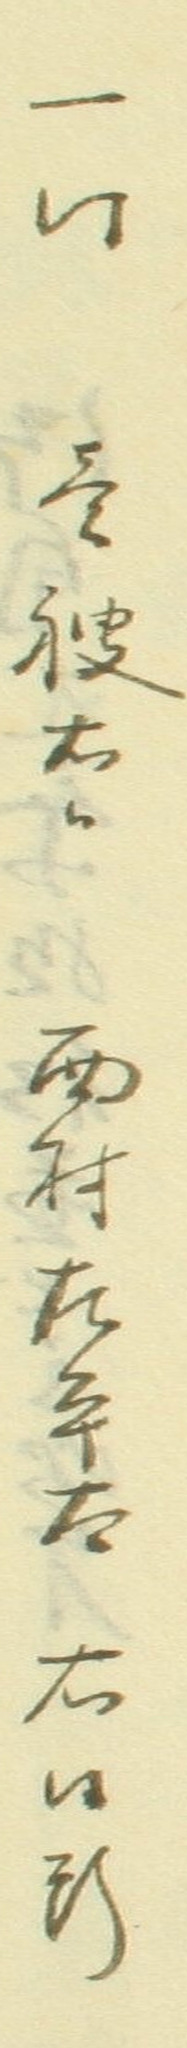一同壱艘右同西村左平太右同断
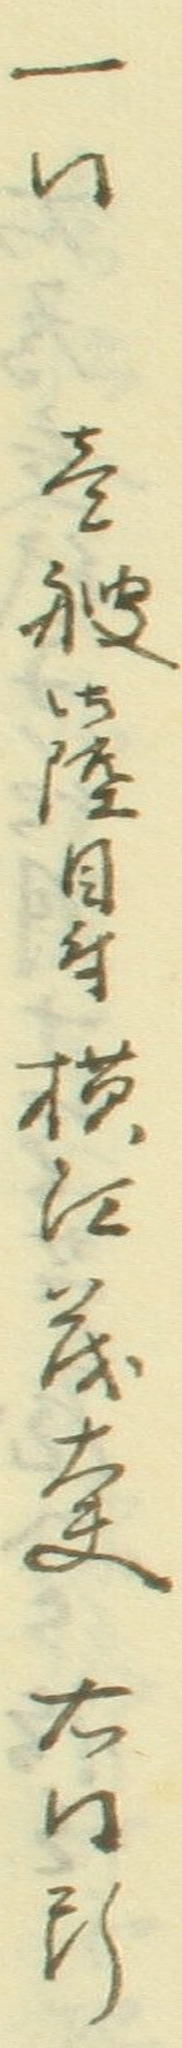一同壱艘御陸目付横江茂太夫右同断
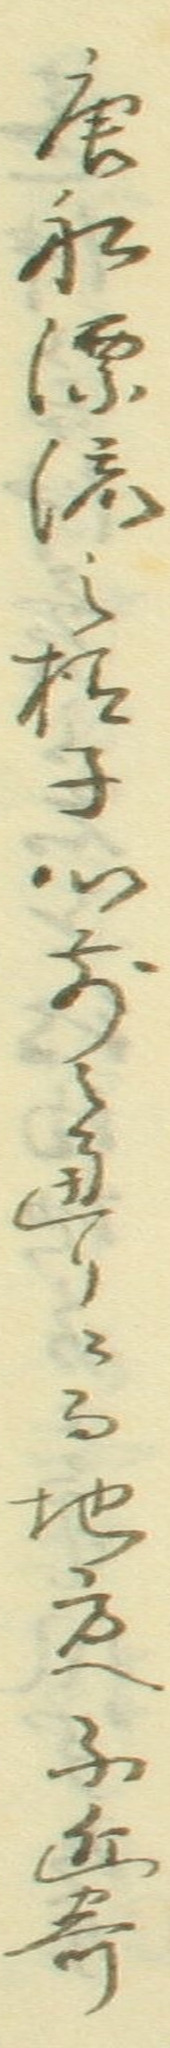唐船漂流之様子以前之通りに而地方へ不近寄

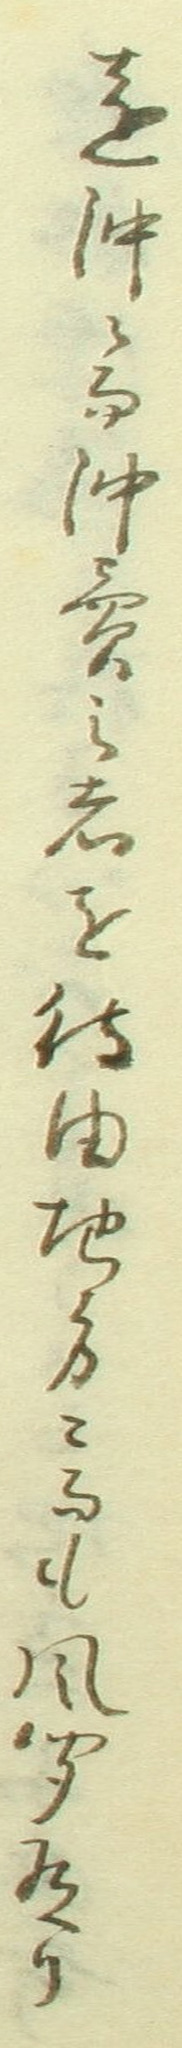遠沖に而沖売之者を待由地方に而も風聞有り
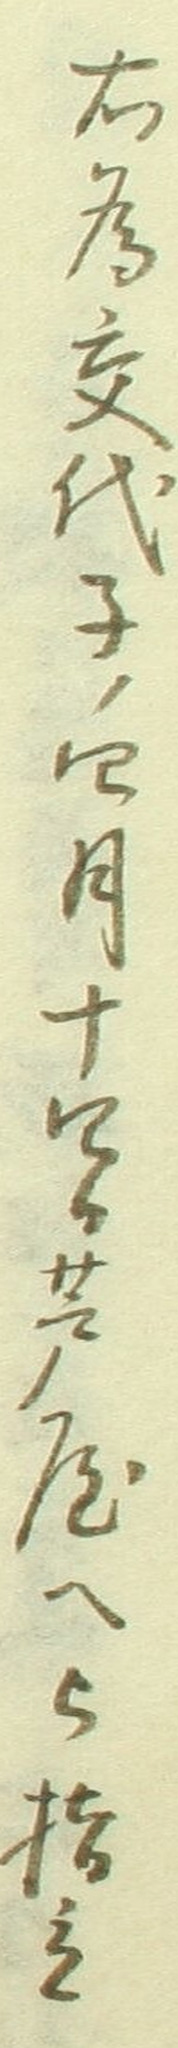右為交代子の四月十四日芦屋へ被差立
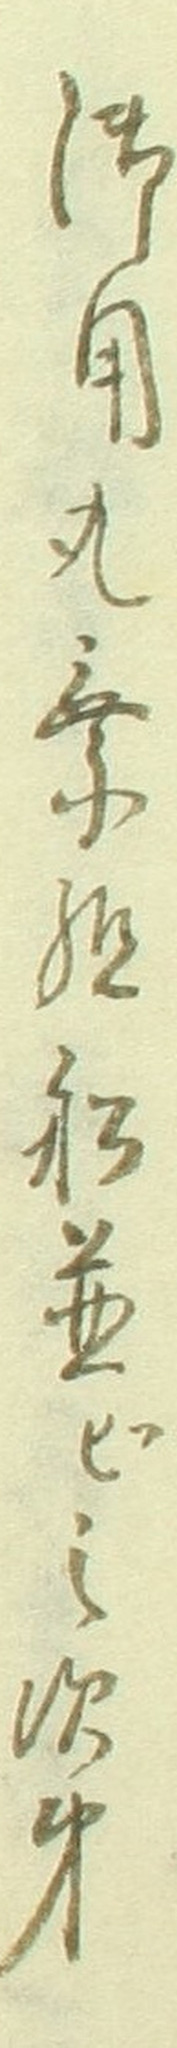御用丸乘組船並び之次第
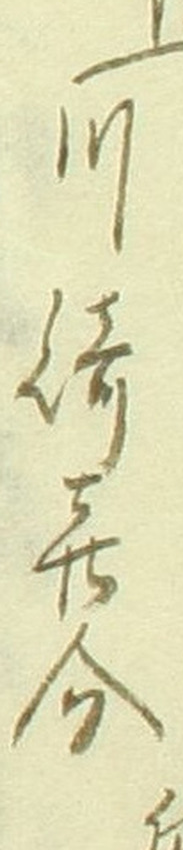川崎喜助
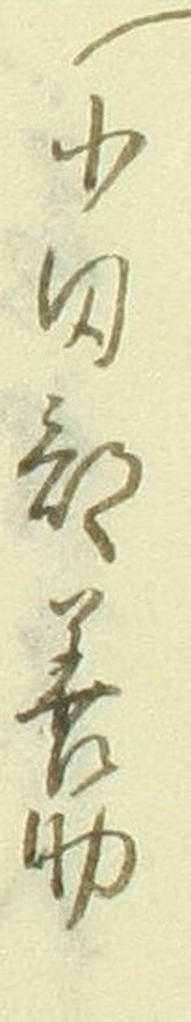小田部善助
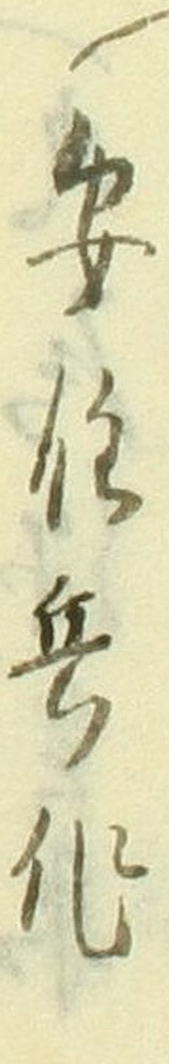安住兵作
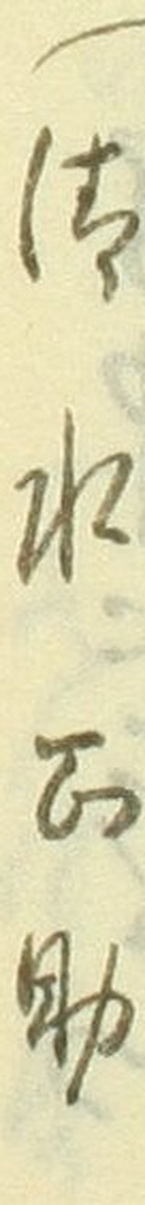清水正助
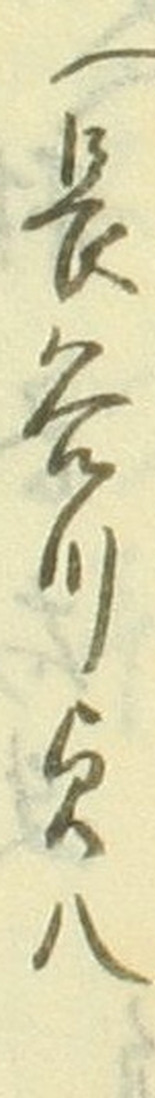長谷川貞八
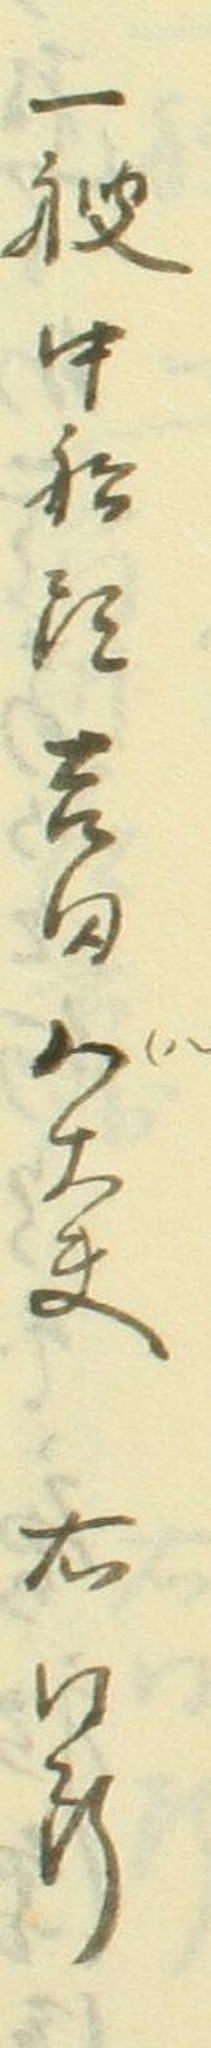一同一艘中船頭吉田八太夫右同断
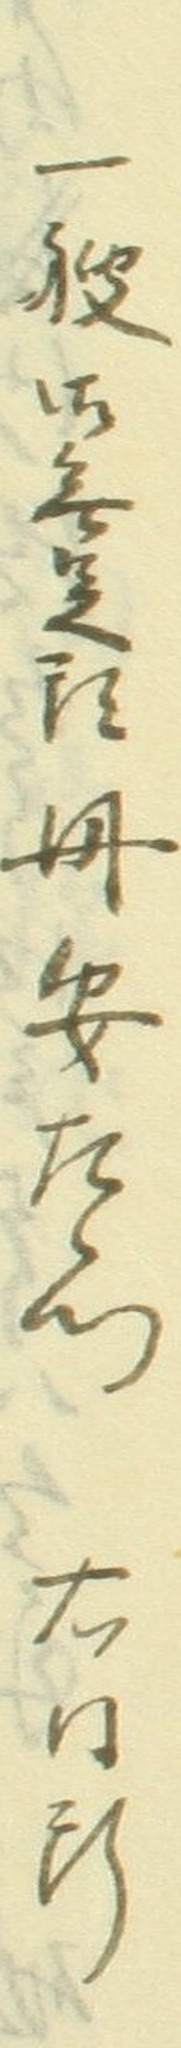一同一艘御無足頭丹安左衛門右同断
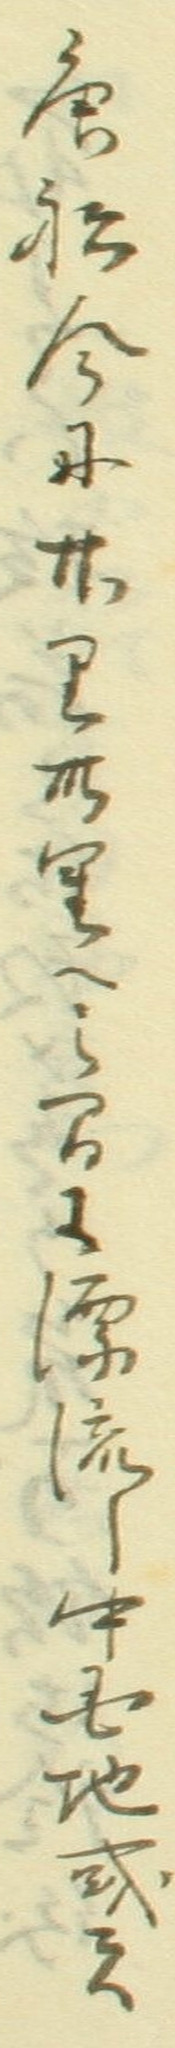唐船今に廿里卅里へ之間に漂流し中国地或者
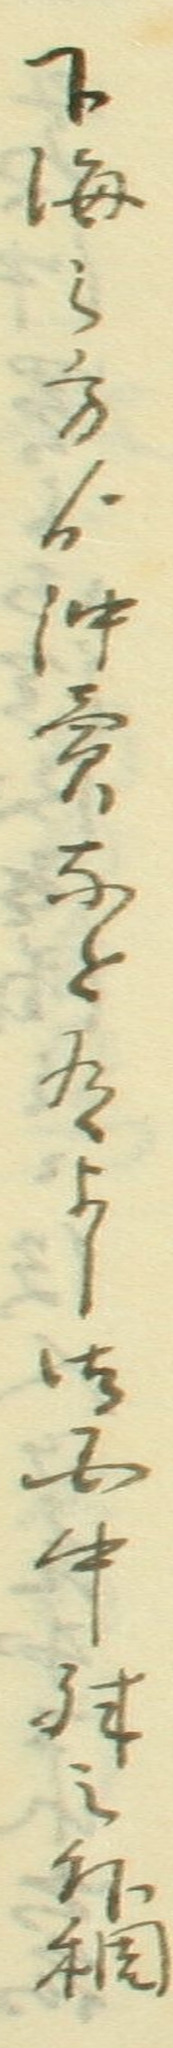下海之方ゟ沖売なと有よし御国中殊之外稠
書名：唐船漂流記 四
